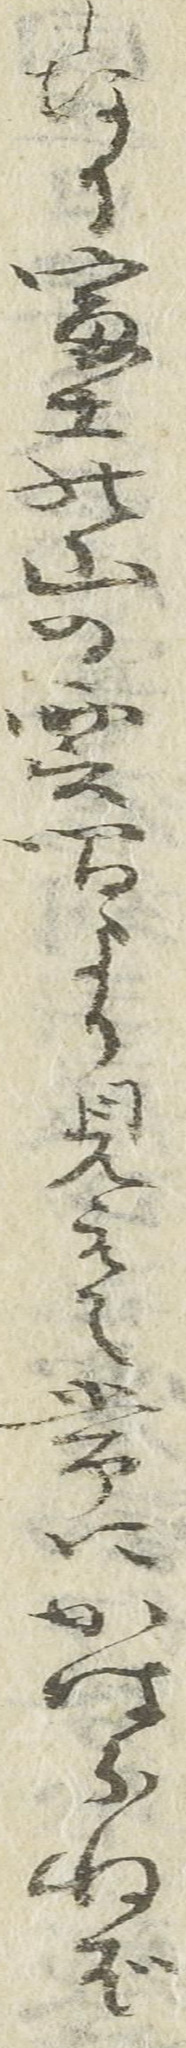しなり富士の山の雲間より見えて常にかはらねぞ
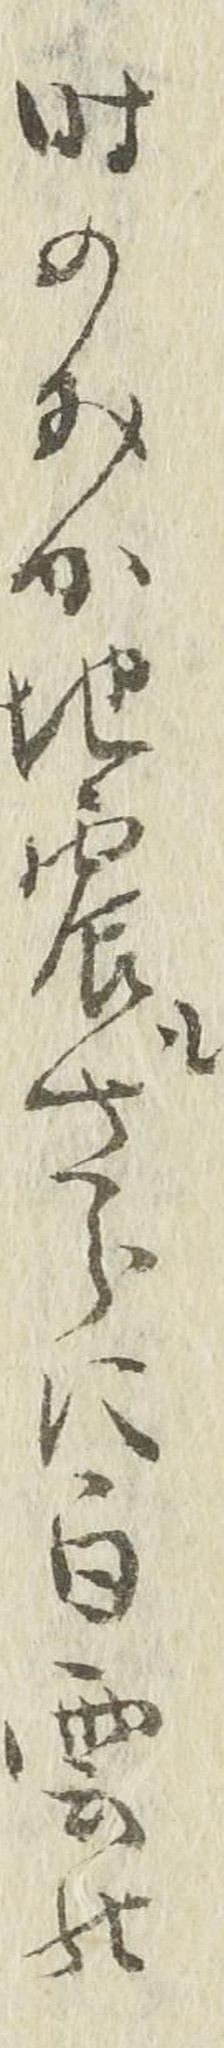時のみか地震もさらに白雲の
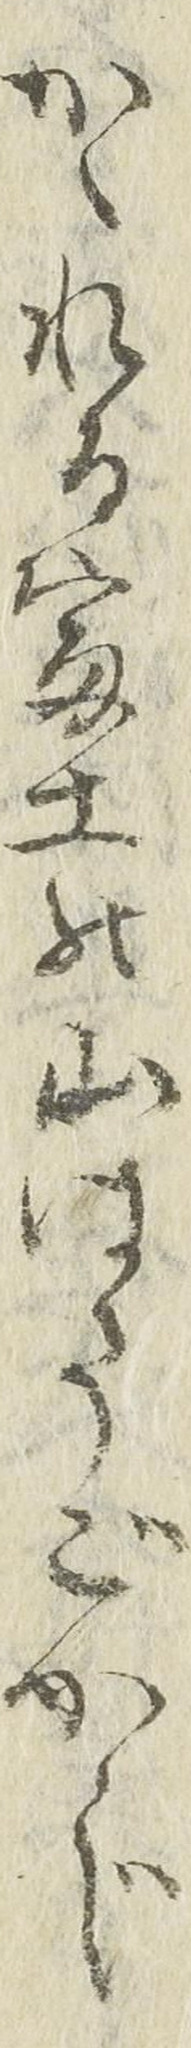かゝれる富士の山はうごかじ
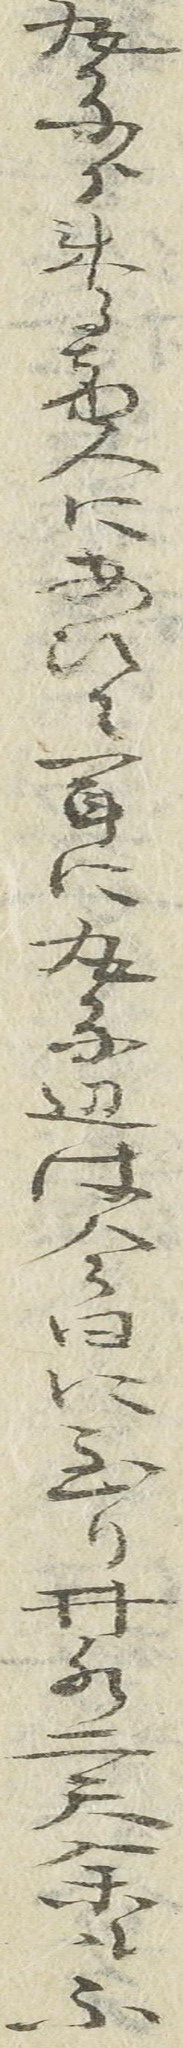丸子ゟ来る商人にあひて聞に丸子辺は今日に至り井水二尺余もふ
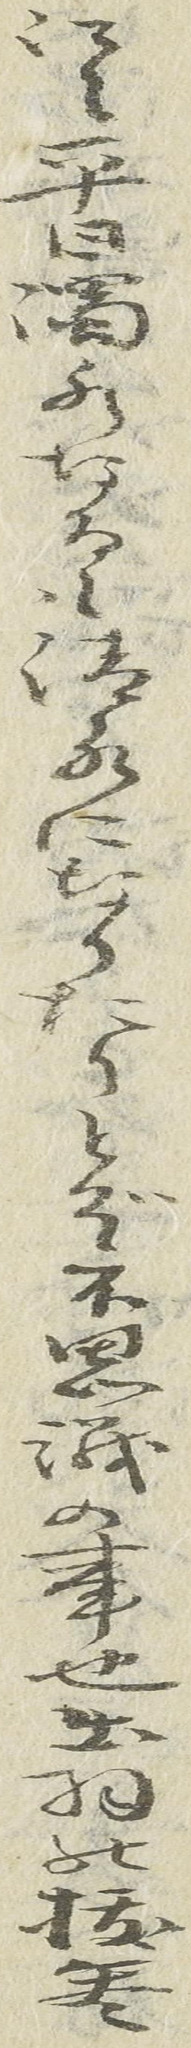えて平日濁水なるも清水になりたりとぞ不思議の事也出羽の抜参
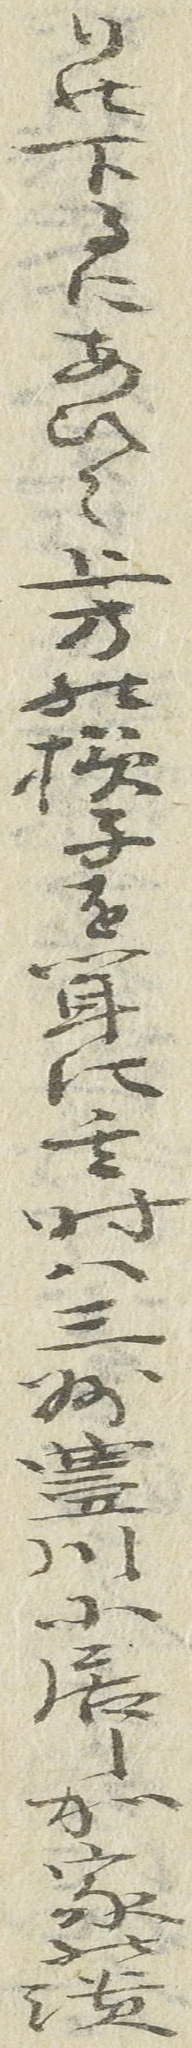りの下るにあひて上方の様子を聞に其時は三州豊川に居しか家の潰
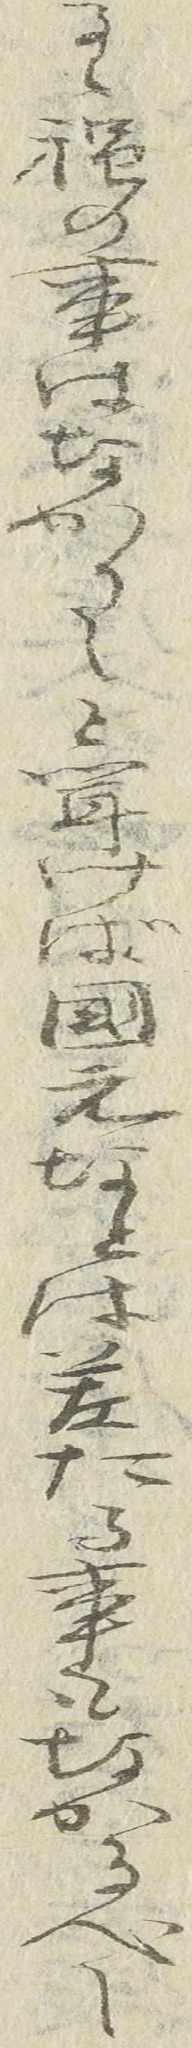るゝ程の事はなかりしと聞けば国元なとは差たる事もなかるべし

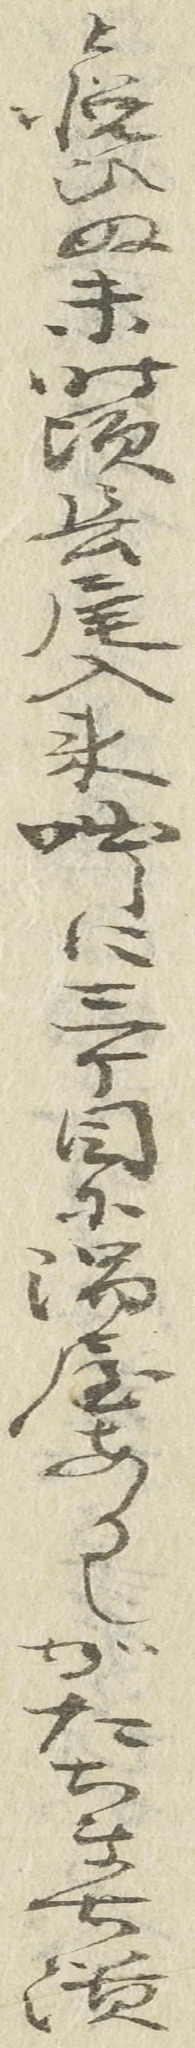と悦ひぬ未時頃長尾入来咄しに三丁目に湯屋ありしがたちまち潰
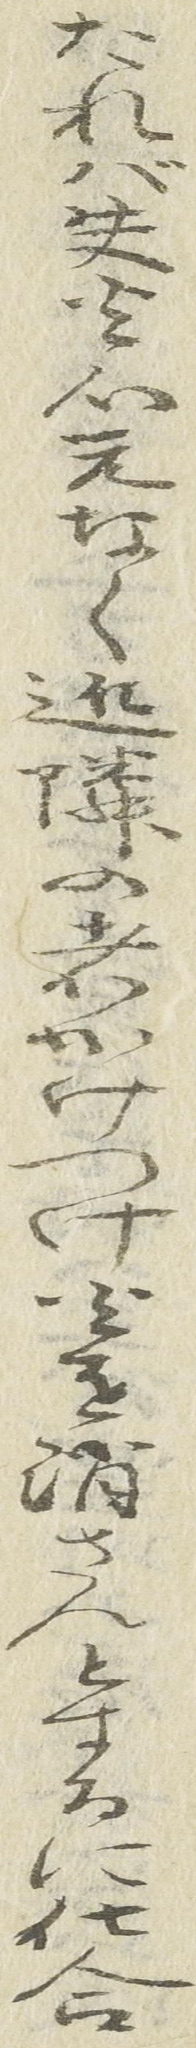たれば失火心元なく近隣の者かけつけ火を消さんとするに仕合
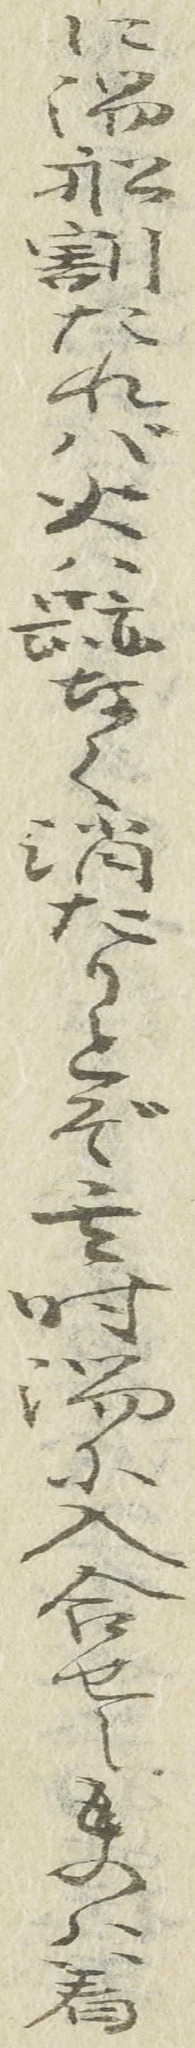に湯舩割たれば火は跡なく消たりとぞ其時湯に入合せしものは着
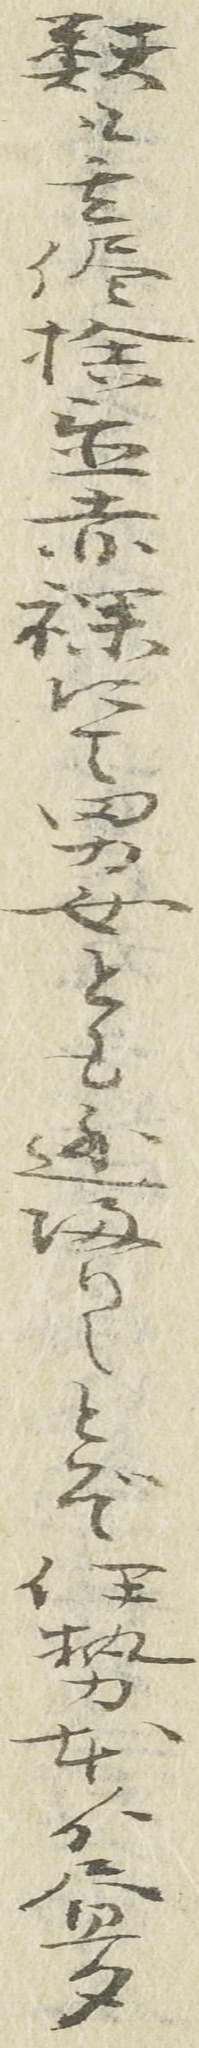類も其儘捨置赤裸にて男女とも逃帰りしとぞ伊勢本ゟ昼夕
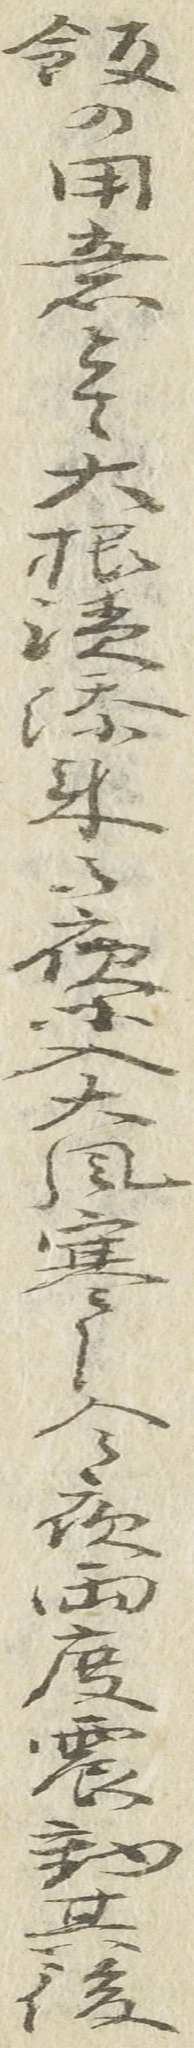飯の用意とて大根漬添来る夜に入大風寒し今夜両度震動其後
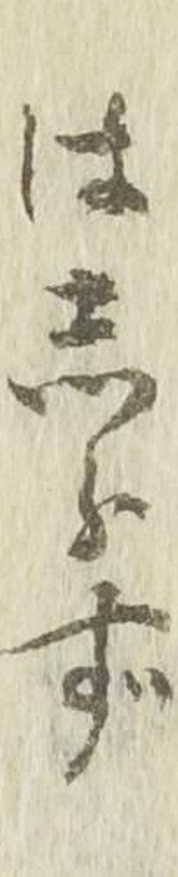はしらず
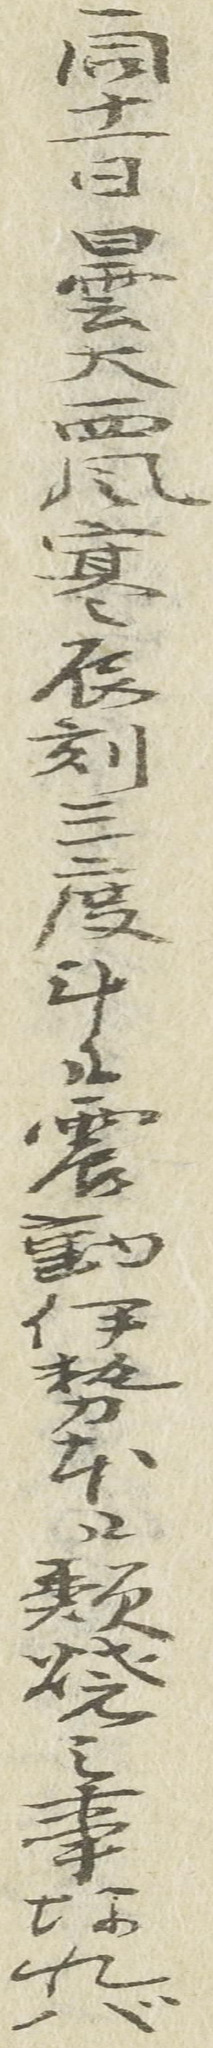一同十一日曇大西風寒辰刻三度斗も震動伊勢本も類焼之事なれば
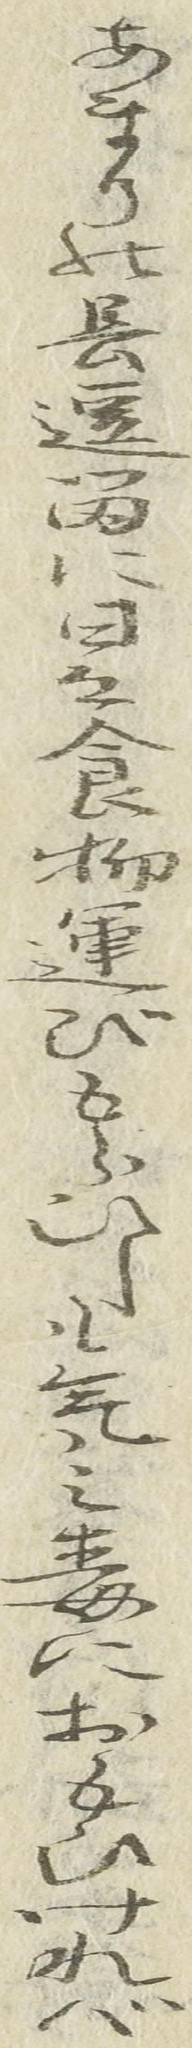あまりの長逗留に日々食物運びもらいしも気之毒におもひければ
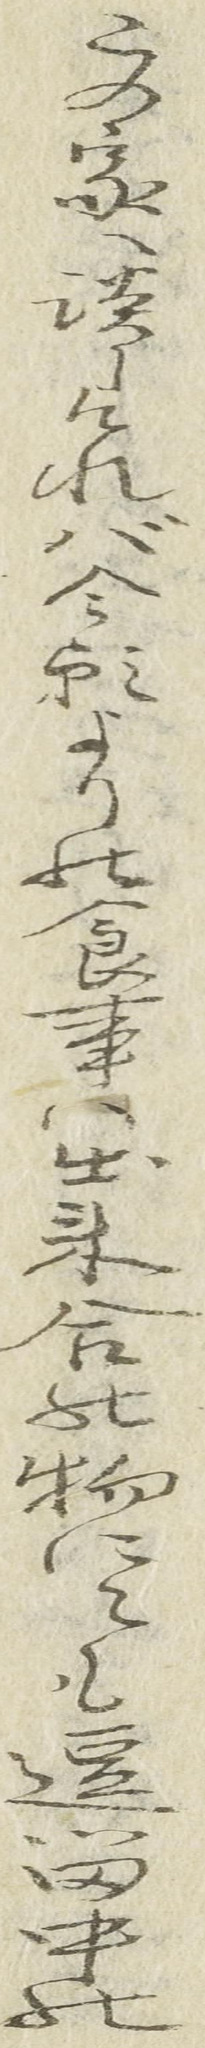この家へ談しければ今朝よりの食事は出来合の物にても逗留中の
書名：地震前兆集　全
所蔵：東京大学地震研究所図書室 Earthquake Research Institute Library, The University of Tokyo, JAPAN
